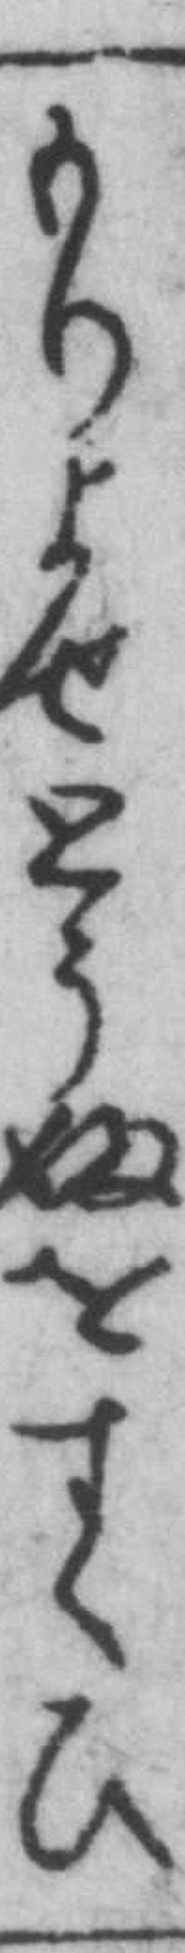もりよせとうふをすくひ
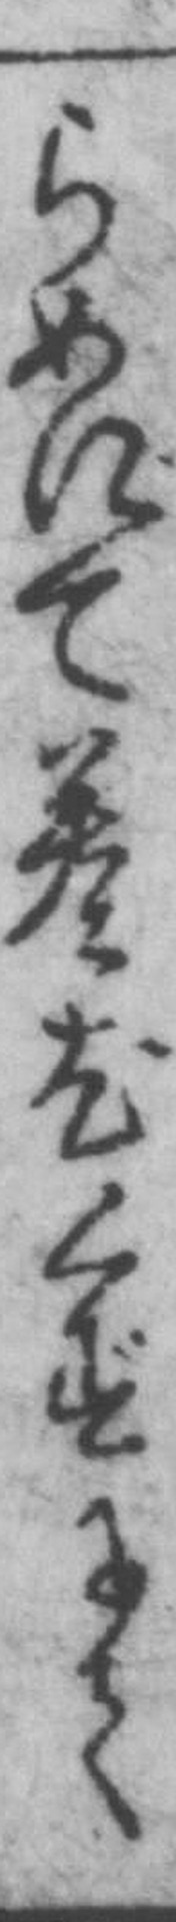らめにて巻くずにて
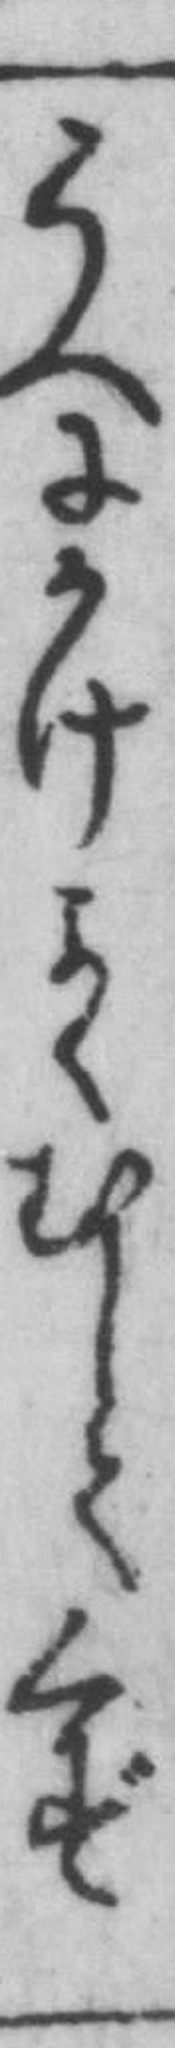うへにかけよくむしてくず
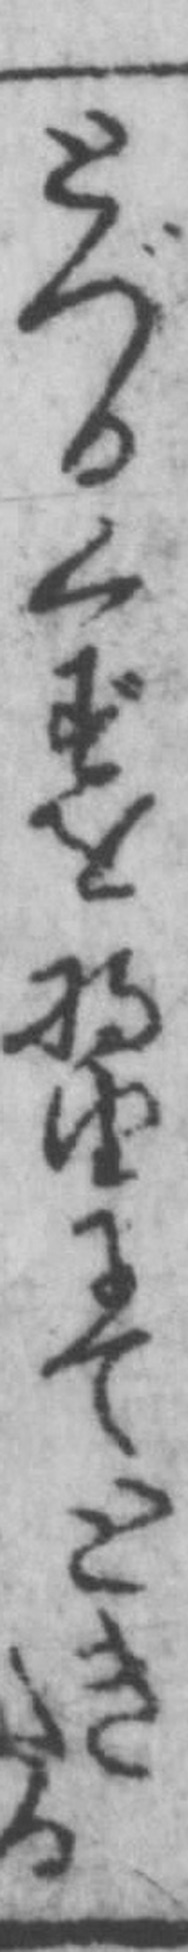とづるくずを醤油にてときたる
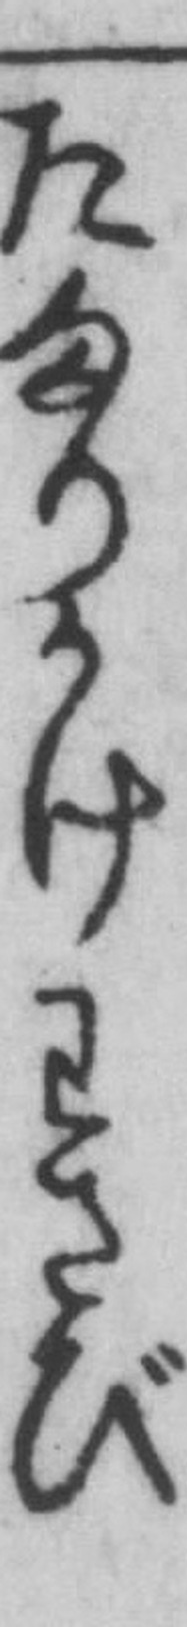たまりかけわさび
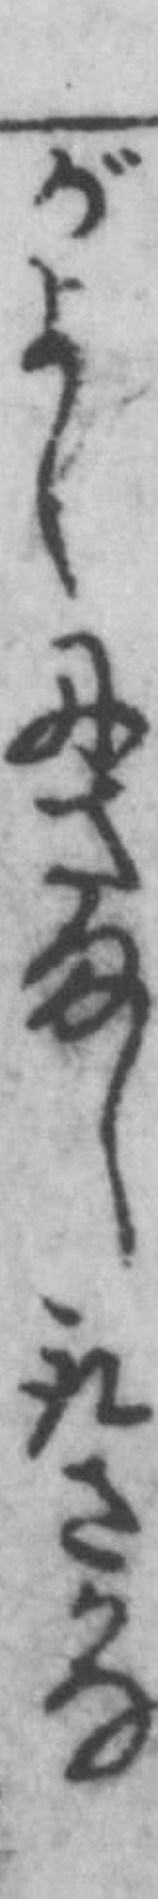がよしにさまし取さかな
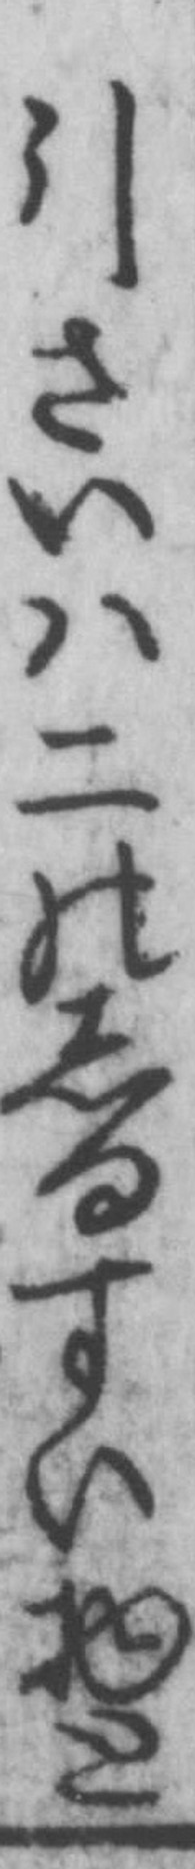引さいハ二のしるすい物と
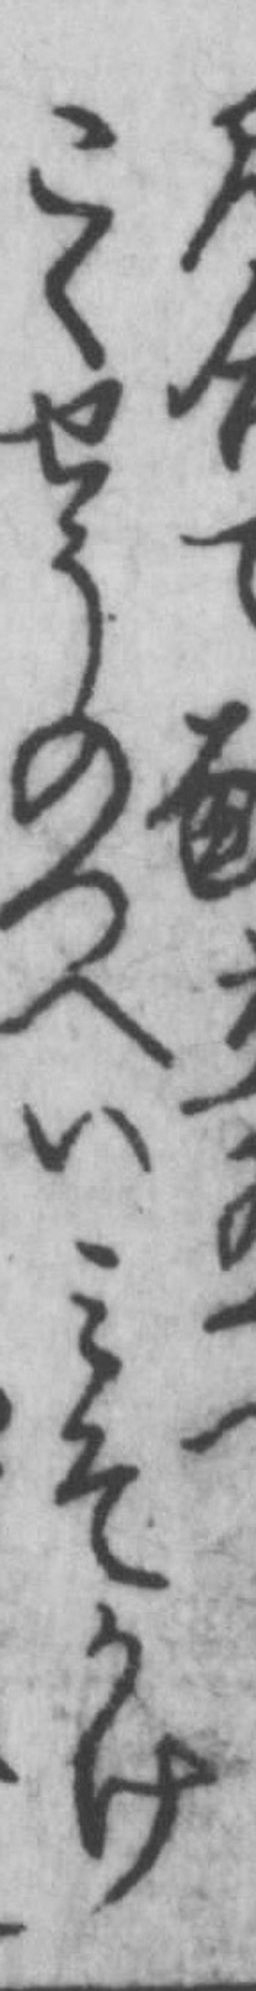こくせうのつへいミそかけ
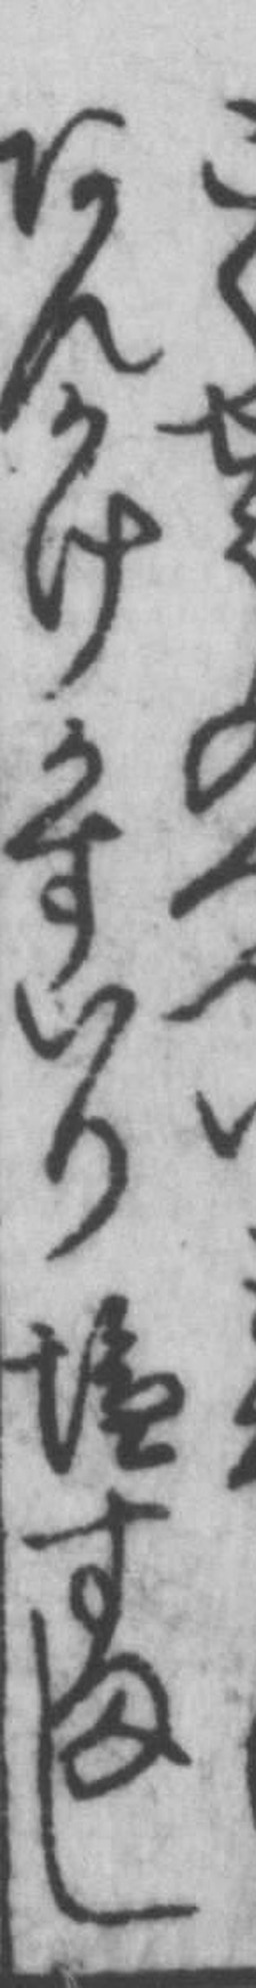あんかけうすいり塩すまし
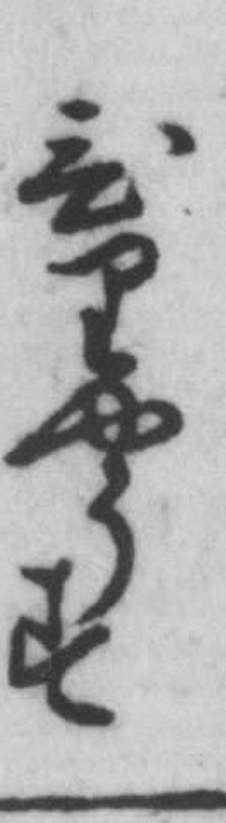ひりやうす
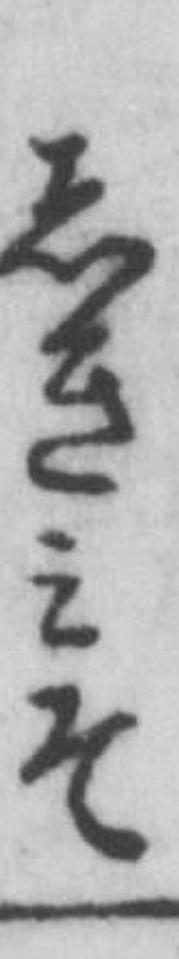しきミそ
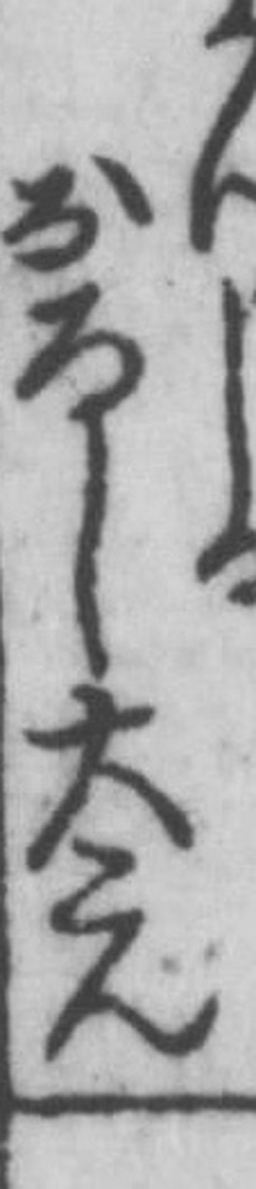おろし大こん
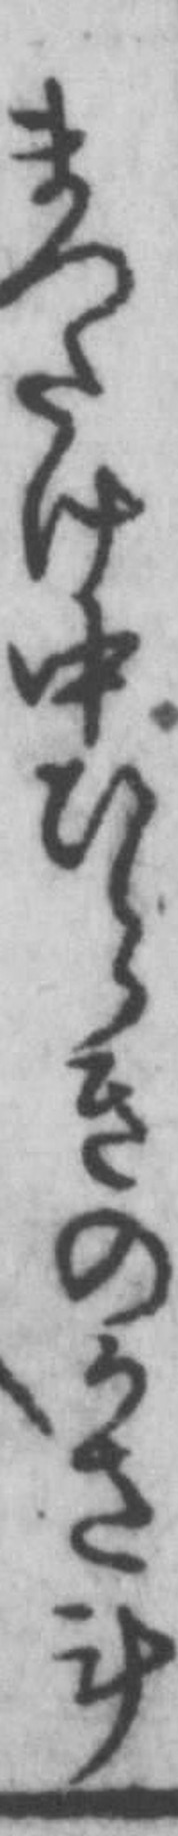まつたけなかびらきのかさ斗
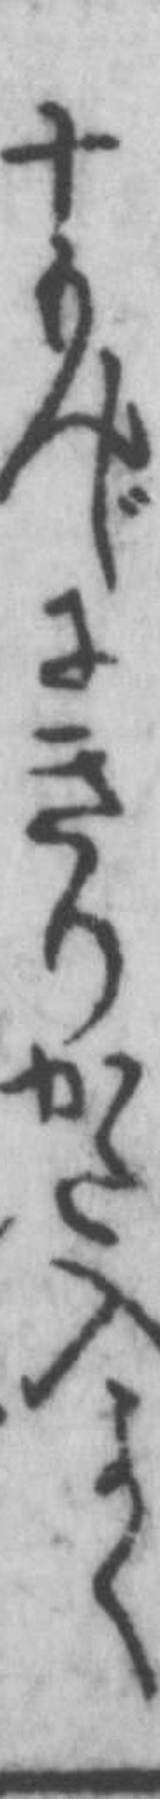十もんじにきりかた入よく
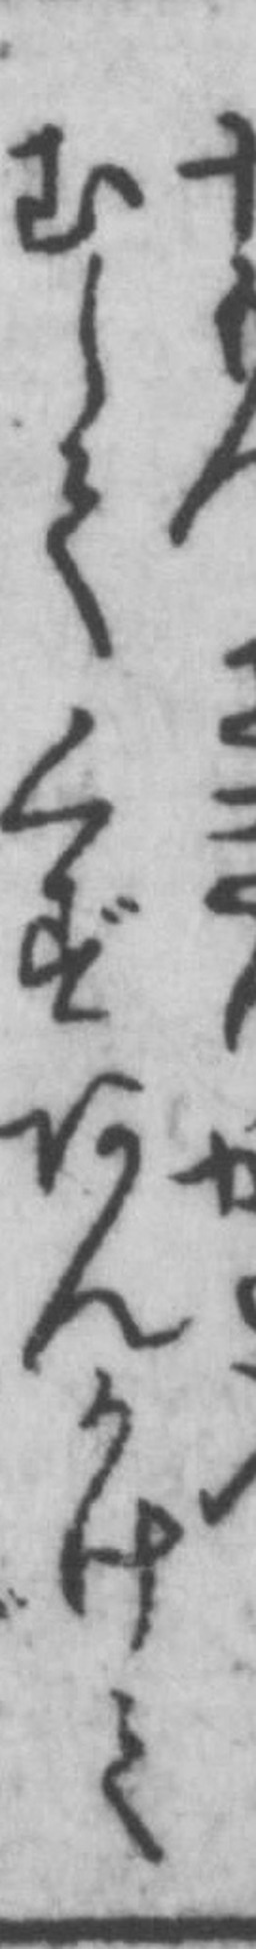むしてくずあんかけて
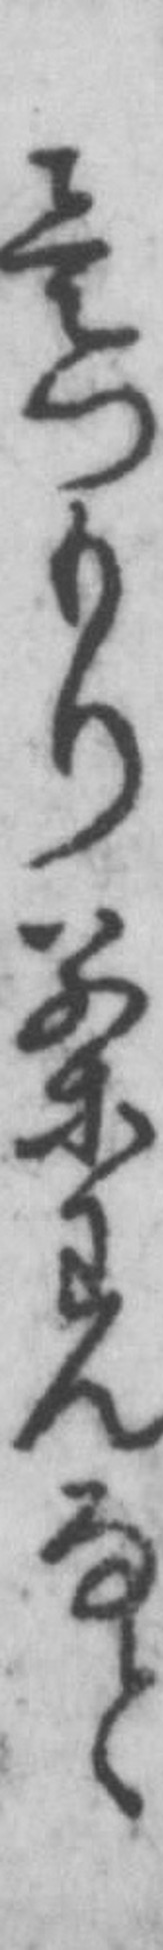壱つもり茶わんなど
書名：料理献立抄
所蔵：大阪府立大学学術情報センター 国文学研究資料館
